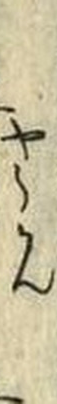やうかん

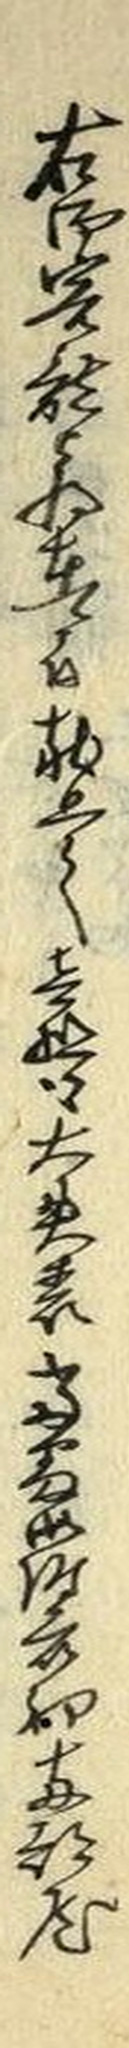右御容體被為在候ニ付献上之壱組ツヽ大奥表当番御附衆初両部屋
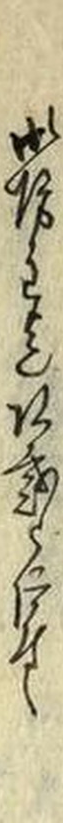御坊主迄頂戴被仰付候
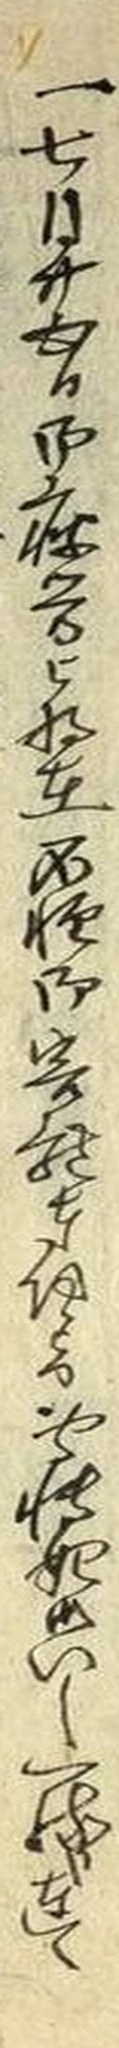一七月廿五日御疲労被為在不軽御容體奉伺候旨専博始御いし一統達候
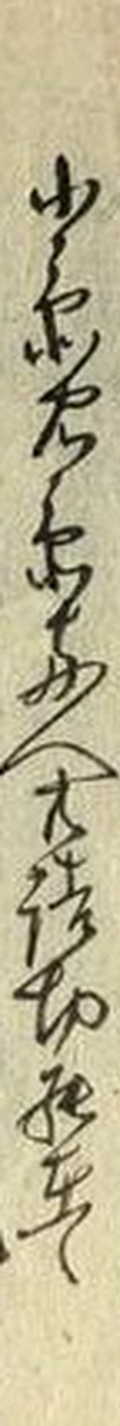小兵衛忠兵衛両人共詰切罷在候
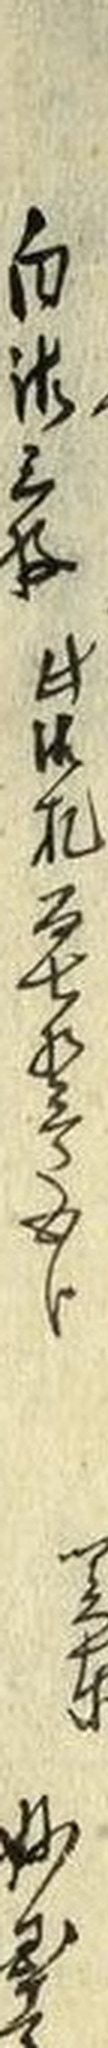白銀三枚此御札百七拾壱匁五分関東妙国寺
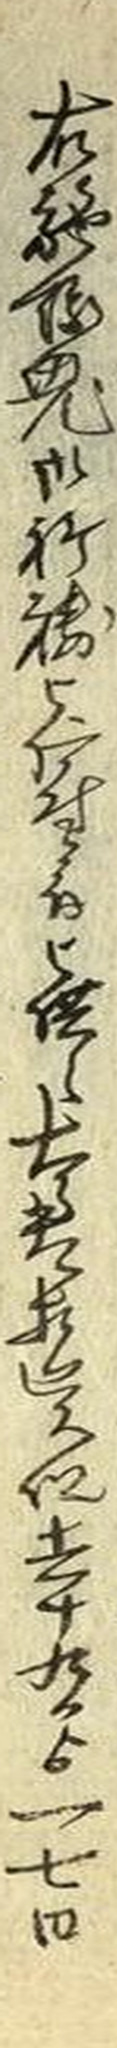右施餓鬼御祈祷被仰付候ニ付被供候大奥相廻ス但去十九日ゟ一七日
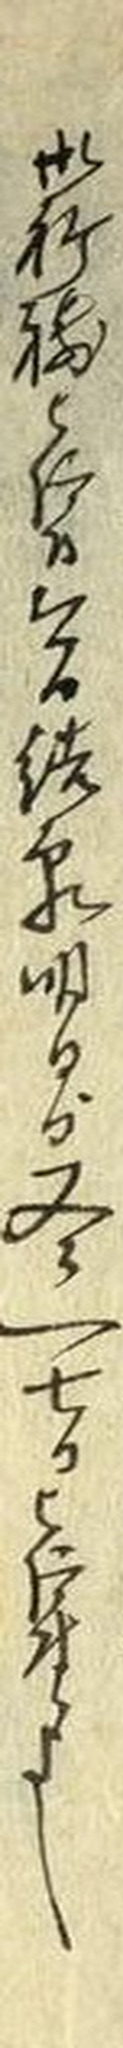御祈祷被仰付今日結願明日ゟ又々一七日被仰付候よし
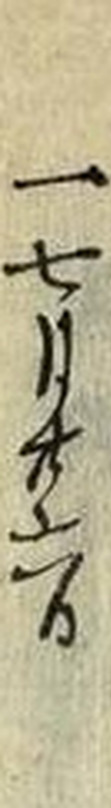一七月廿六日
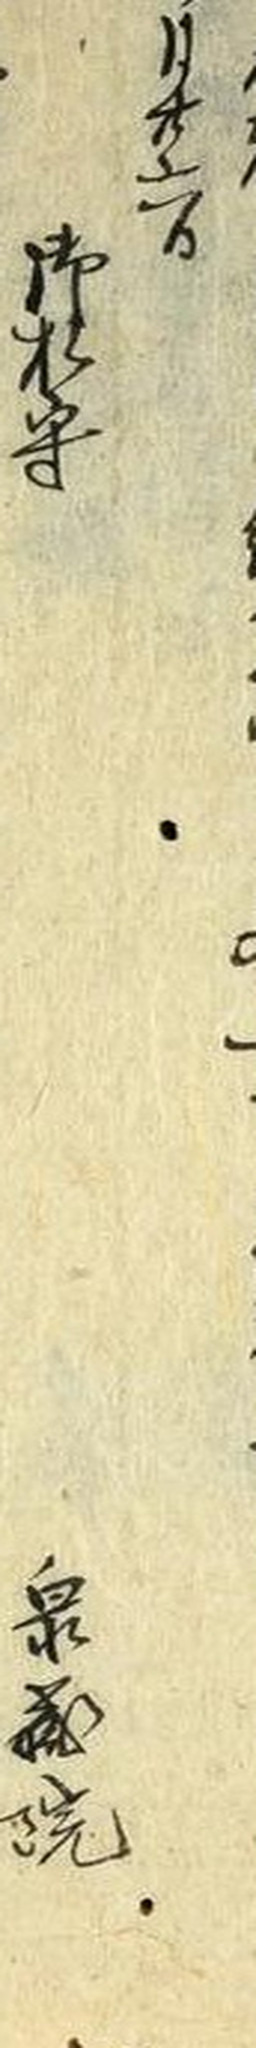御札守泉蔵院
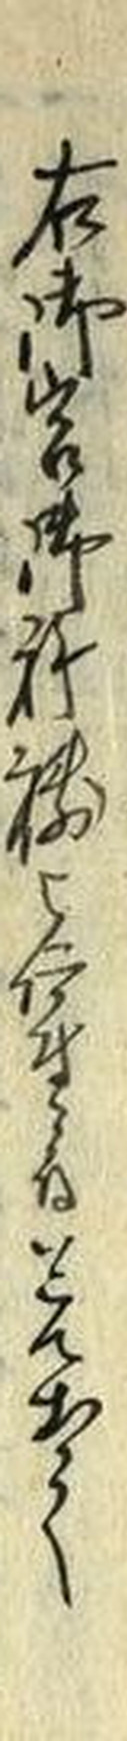右御宮御祈祷被仰付候付差出之
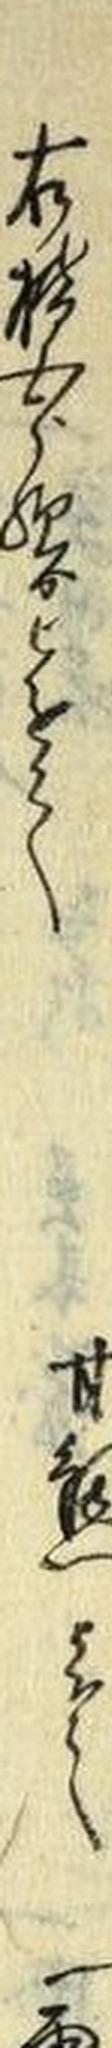右楷五郎様ゟ被進之一柳献助被遣候
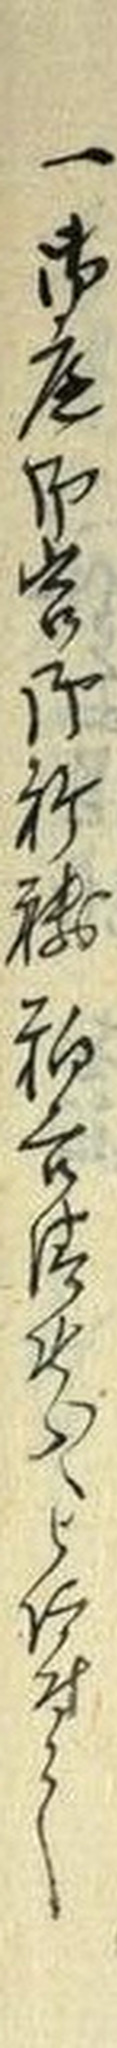一御庭御宮御祈祷粕谷清次郎へ被仰付之
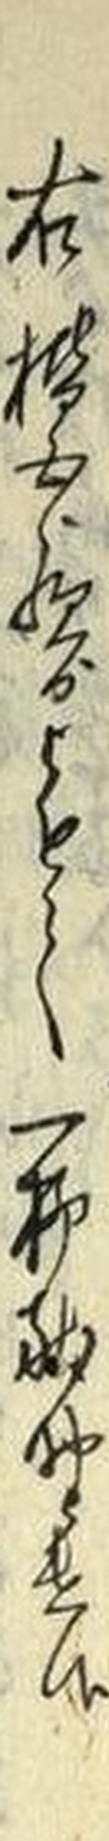右楷五郎様ゟ被進之一柳献助被遣候
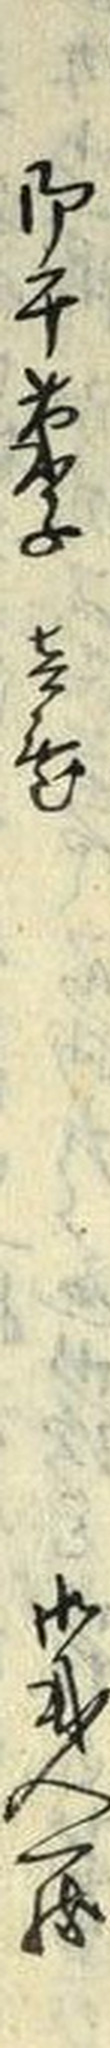御干菓子壱台御用人一統
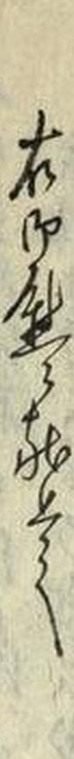右御慰ニ献上之
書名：少傅日録抄（斉善付側向頭取日記、江戸并道中、初入在国、逝去後…
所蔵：福井県文書館 Fukui Prefectural Archives
